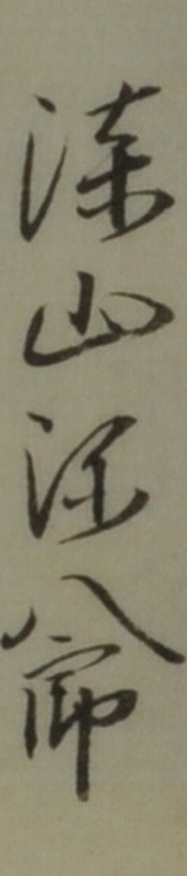漆山弥八郎
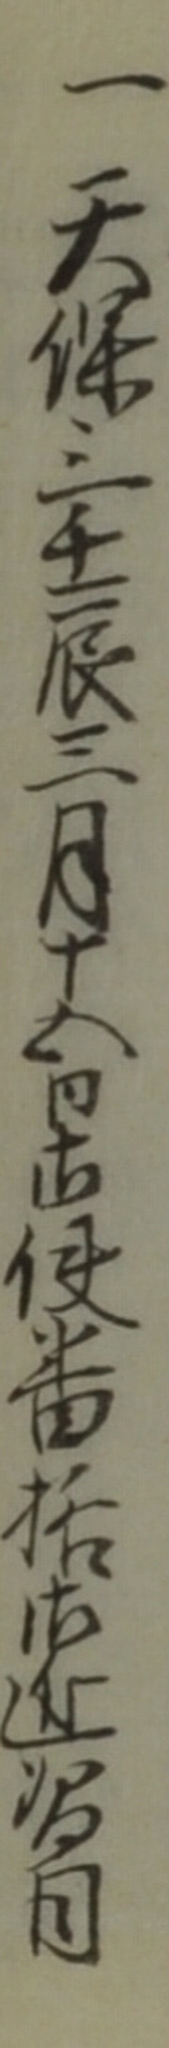一天保三壬辰三月十五日御使番格御近習目
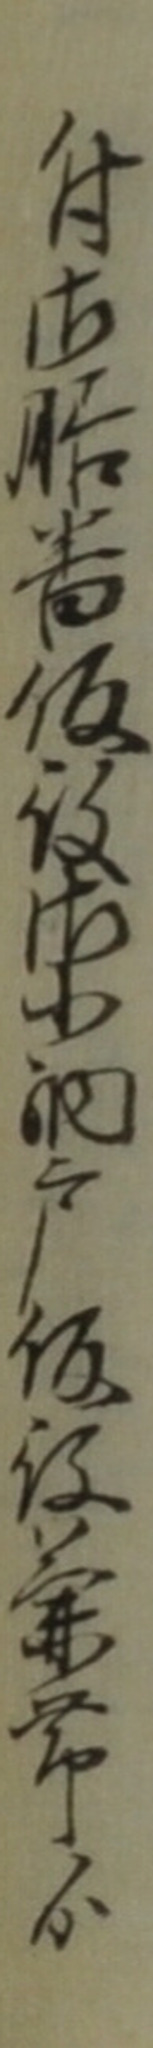付御膳番仮役御小納戸仮役兼帯ゟ
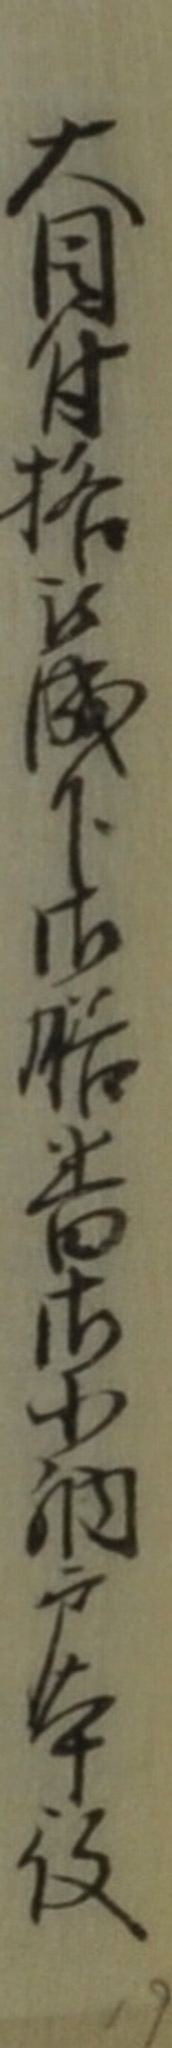大目付格被成下御膳番御小納戸本役
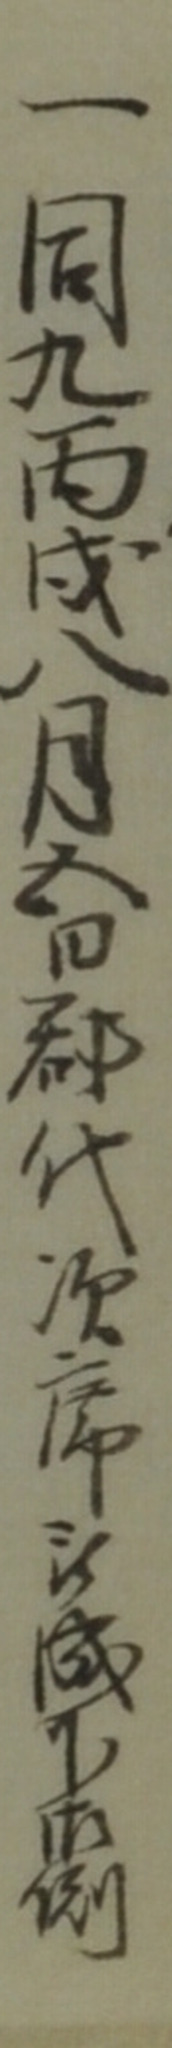一同九丙戌八月五日郡代次席被成下御側
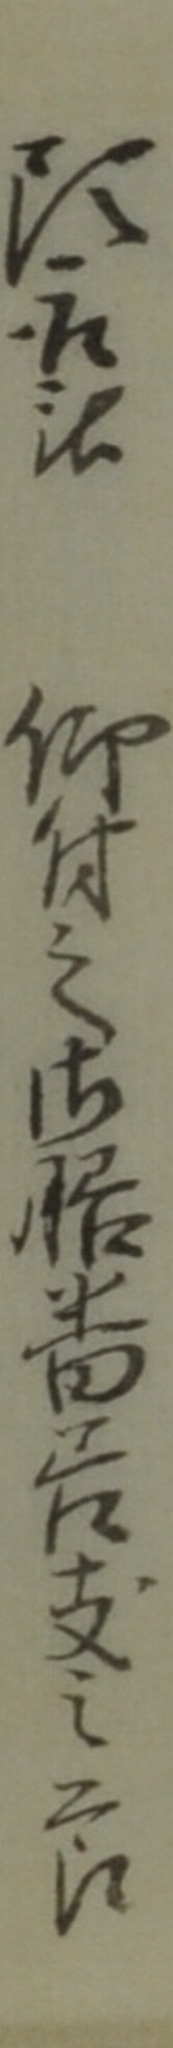頭取被仰付之御膳番差支之節
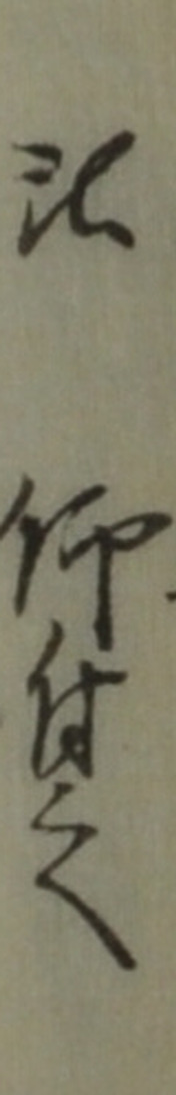被仰付之
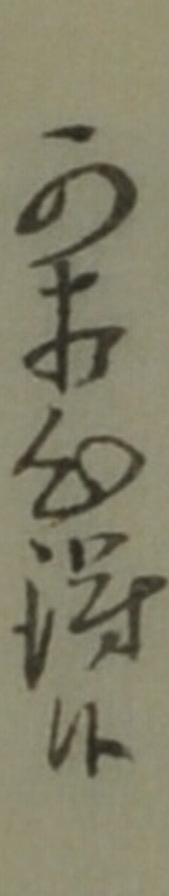可相心得候
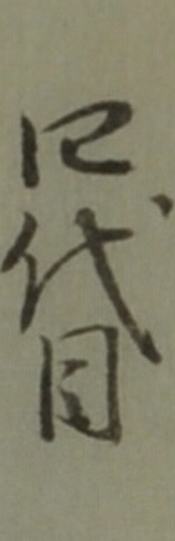四代目
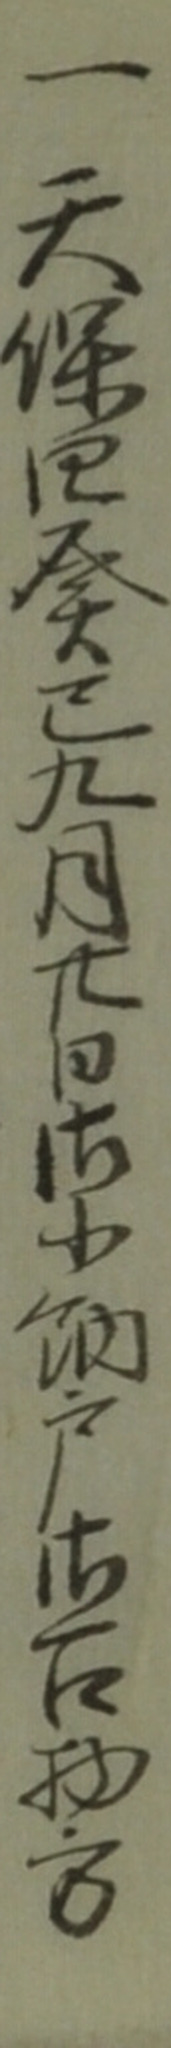一天保四癸巳九月廿日御小納戸御召物方
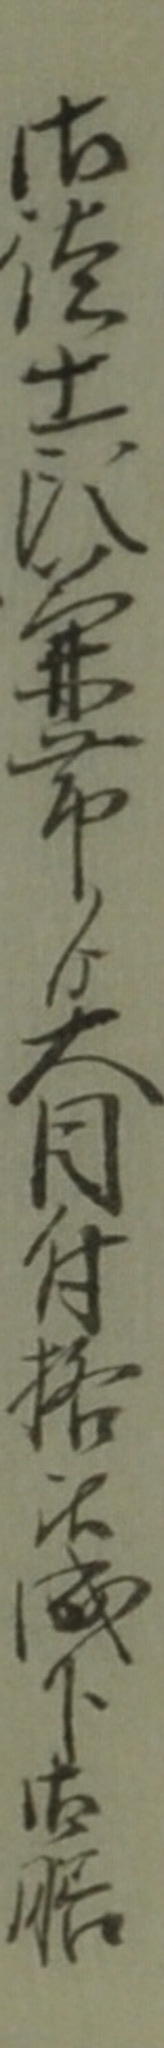御徒士頭兼帯ゟ大目付格被成下御膳
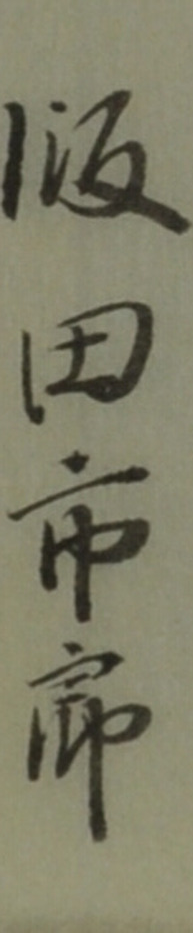飯田市郎
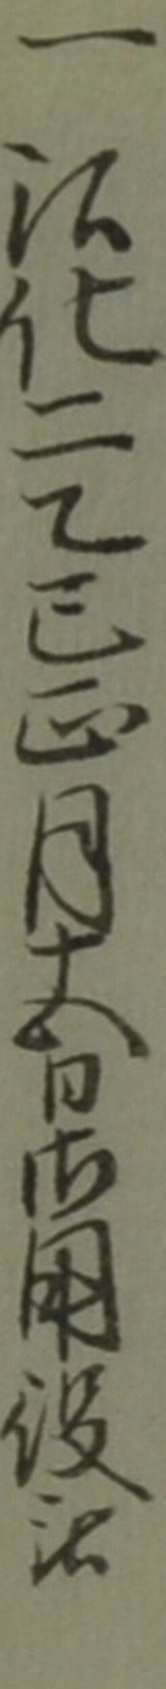一弘化二乙巳正月十五日御用役被
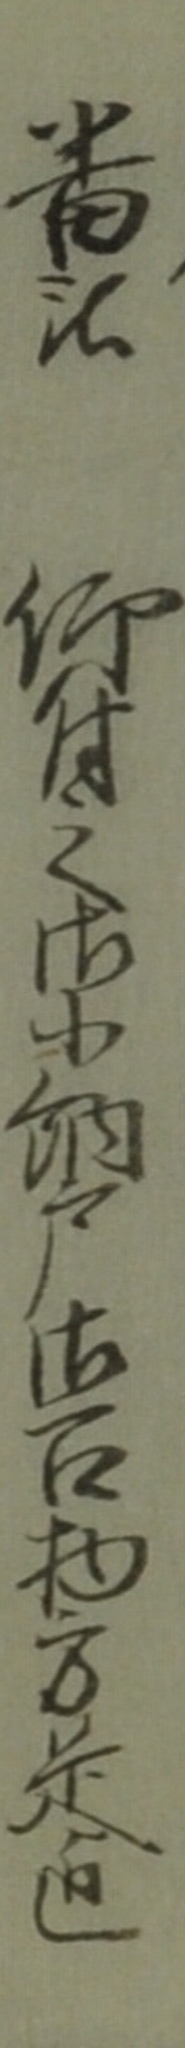番被仰付之御小納戸御召物方是迄
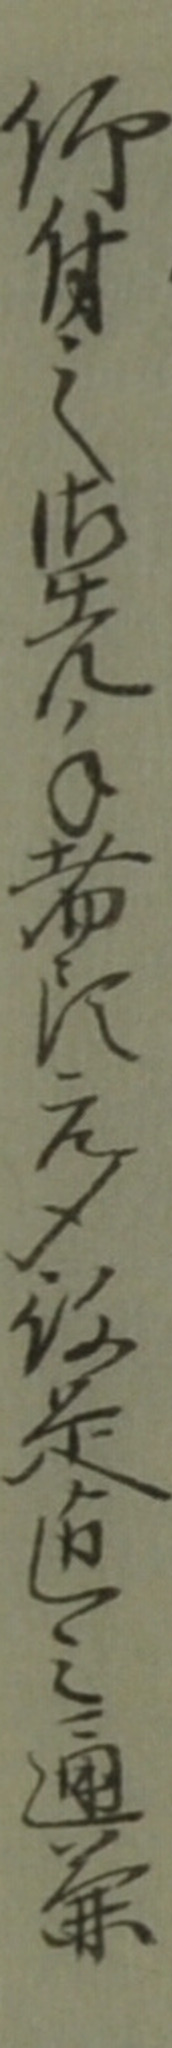仰付之御先手者頭元〆役是迄之通兼
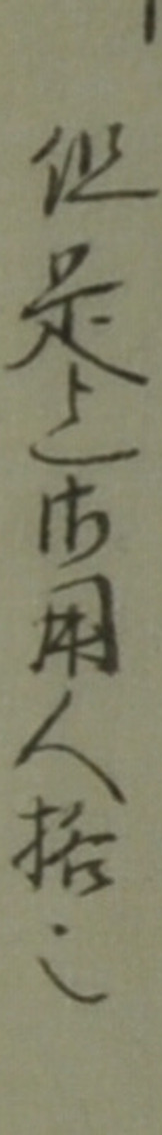但是迄御用人格也
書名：諸御役代々録（四）
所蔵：伊那市立高遠町図書館・合同会社AMANE
